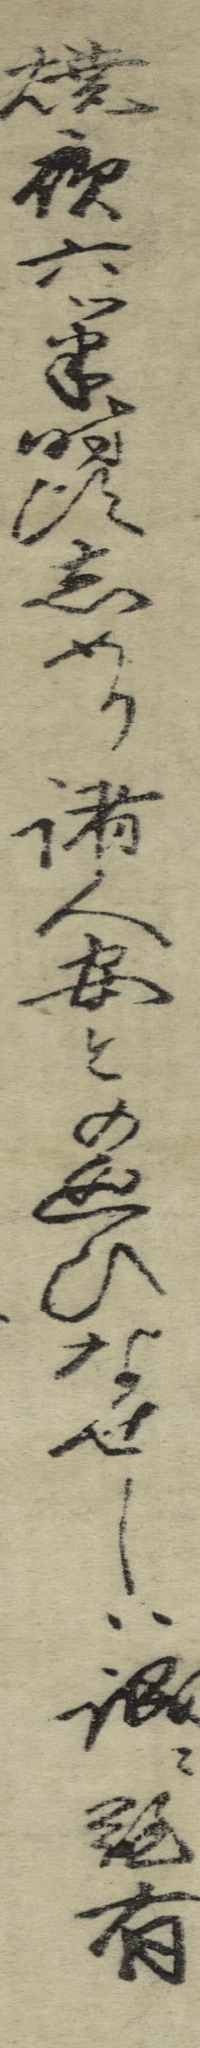焼夜六ツ半時頃しめり諸人安との思ひなせしは誠に難有
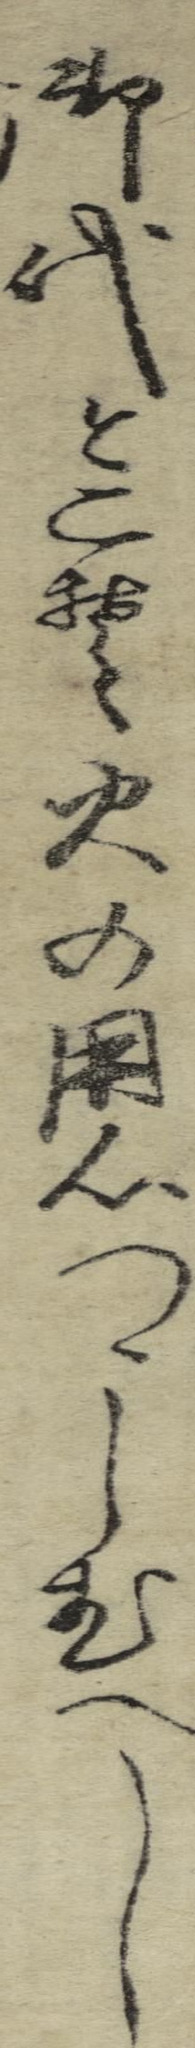御代とこそ火の用心つゝしむへし
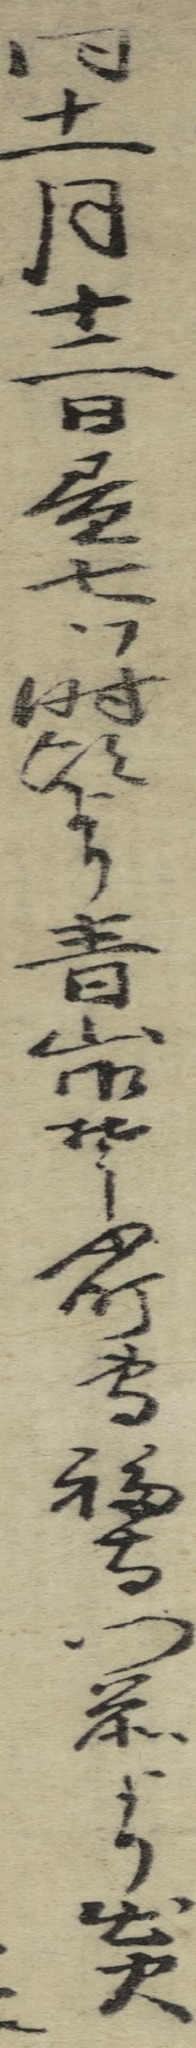同十一月十二日昼七ツ時頃より青山御そうふ？町専福寺門前より出火
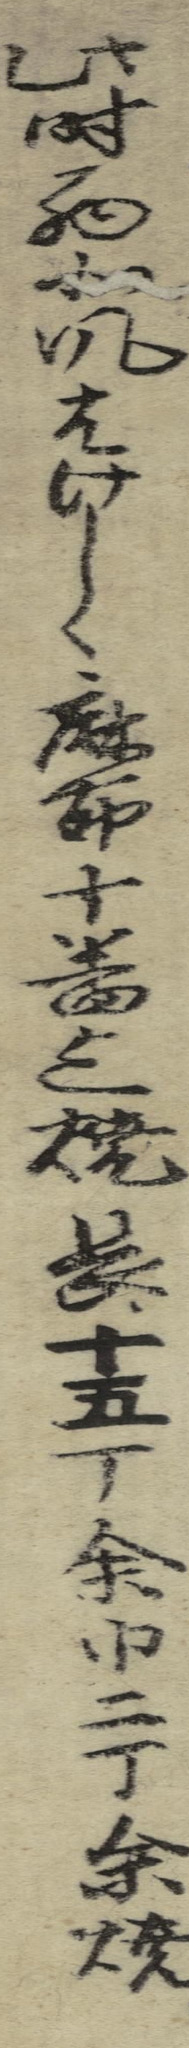此時西北風はけしく麻布十番迄焼長十五丁余巾二丁余焼ル
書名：安政五午十一月十五日焼場方角附
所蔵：東京大学地震研究所図書室 Earthquake Research Institute Library, The University of Tokyo, JAPAN
